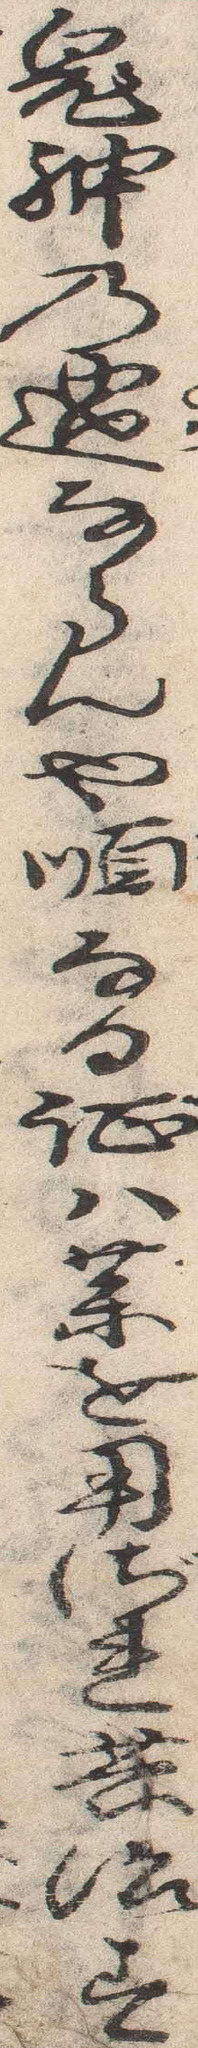鬼神の過ならんや順なる証は薬を用ざれ共治す
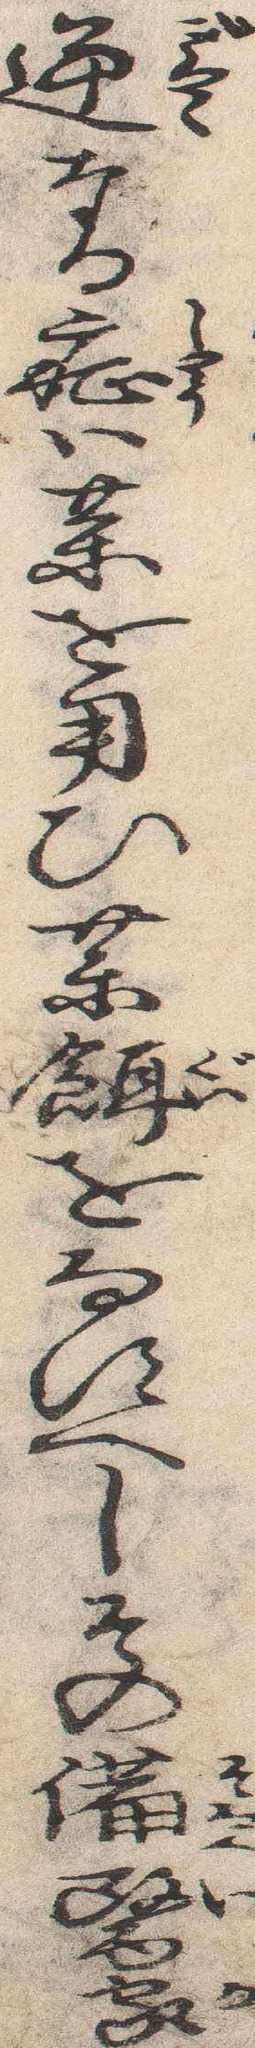逆なる症は薬を用ひ薬餌をなすへしその備医家
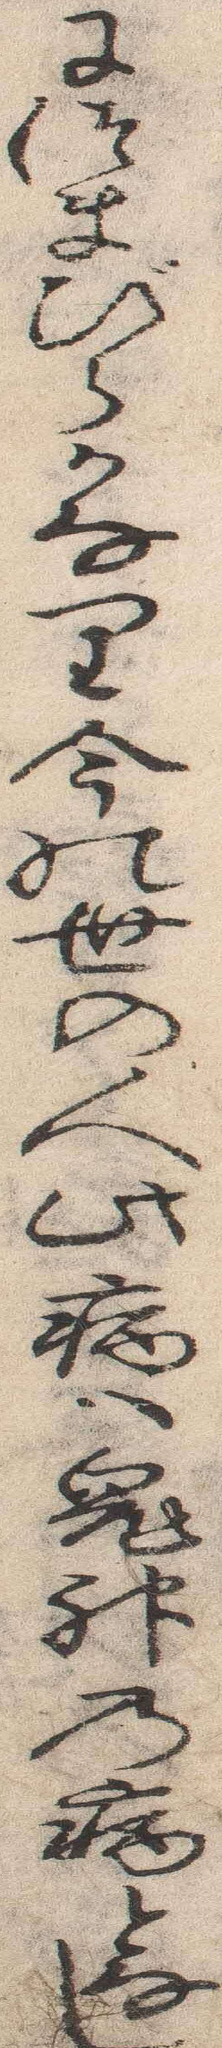につまびらかなり今の世の人此病は鬼神の病となし

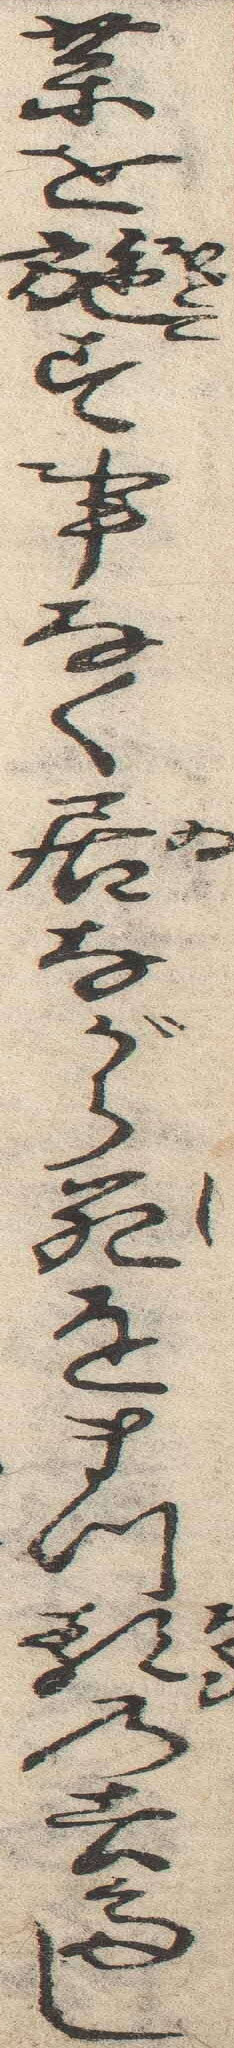薬を施す事なく居ながら死をまつ類の者多し
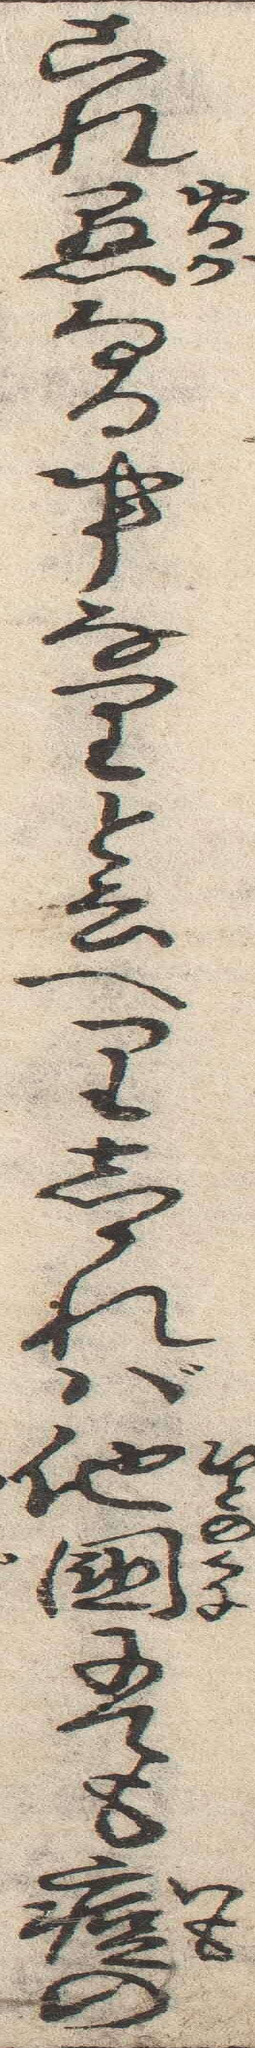これ愚なる事なりと云へりしかれば他国にても痘の
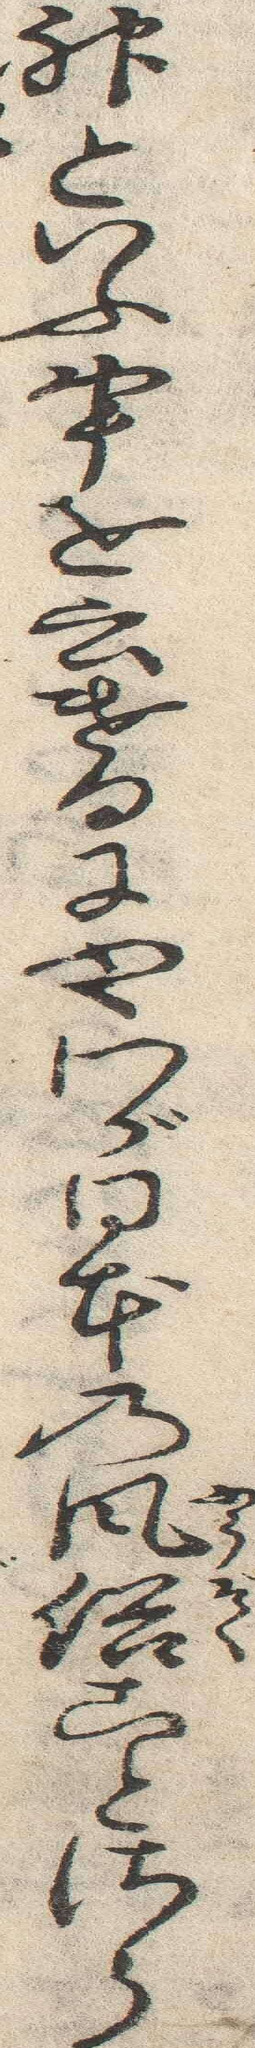神といふ事を云けるにやわが日本の風俗ことさら
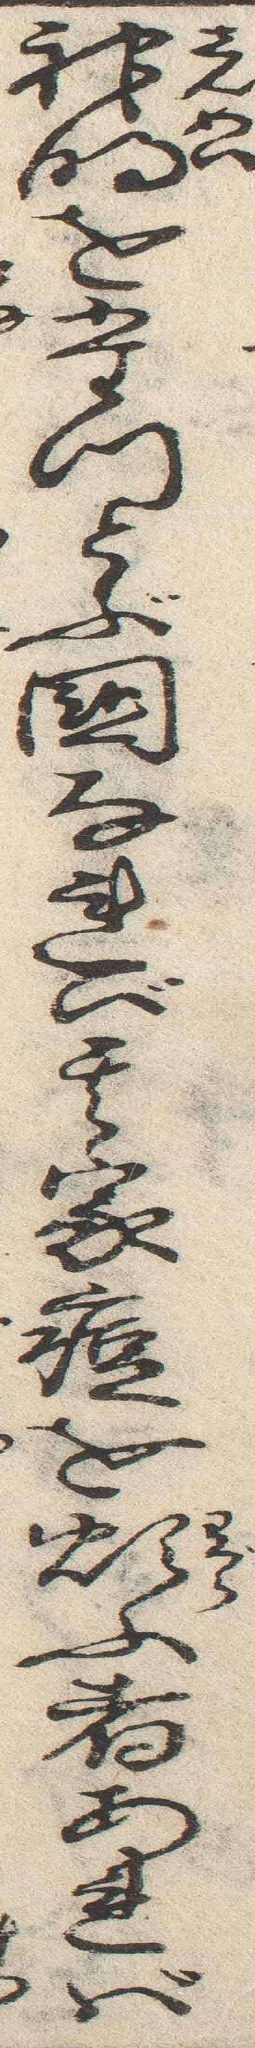神明をたつとぶ国なれば其家痘を煩ふ者あれば
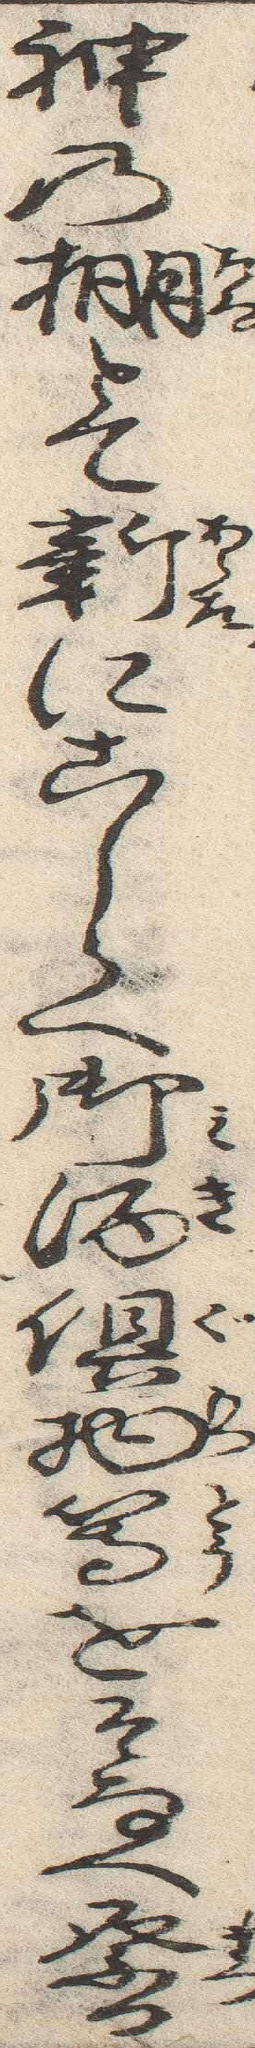神の棚とて新にこしらへ御酒倶物等をそなへ祭る
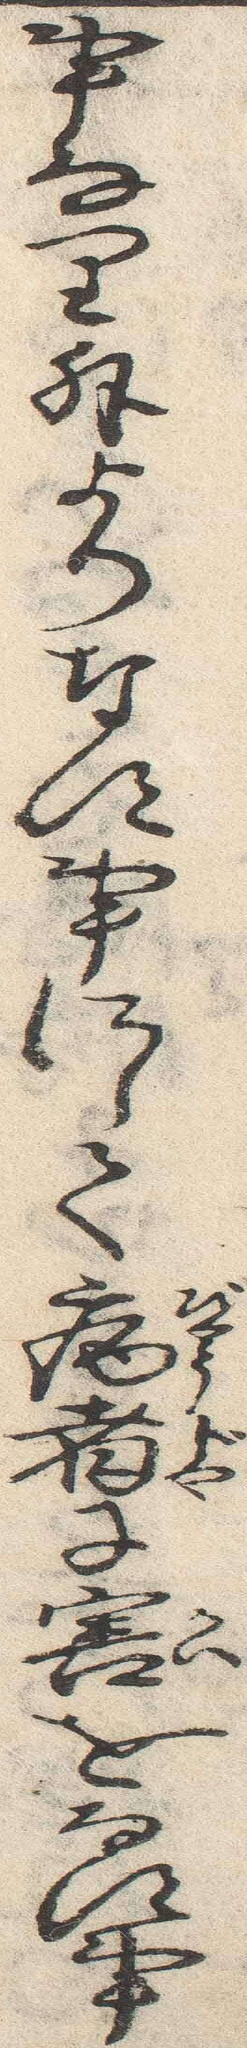事なり外よりなす事さして病者に害をなす事
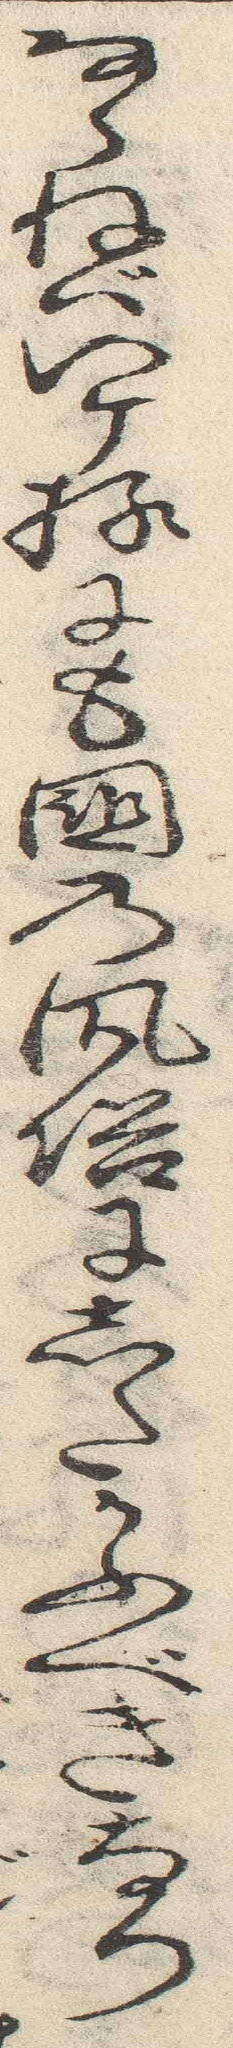ならねばいヶ様にも国の風俗にしたかふべきなり
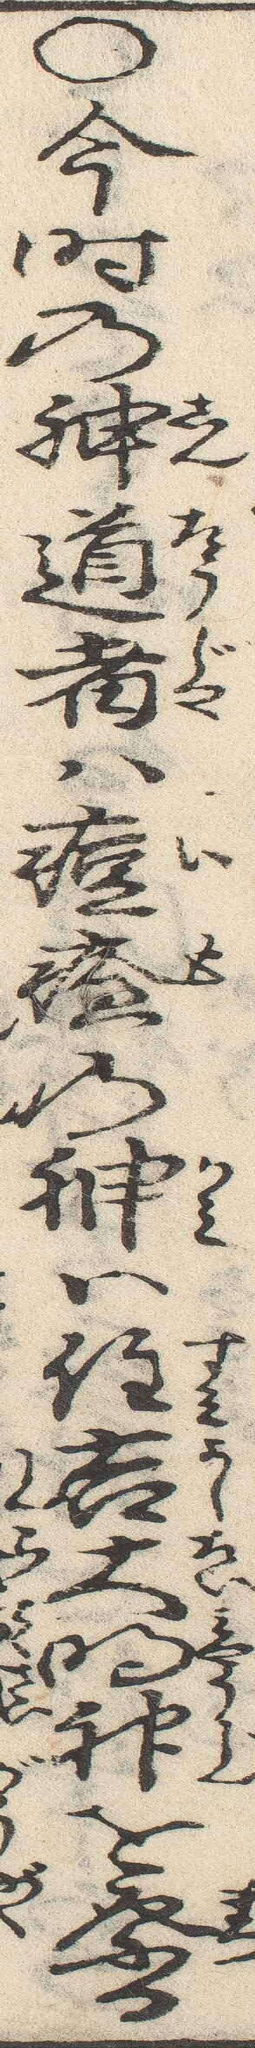○今時の神道者は痘瘡の神は住吉大明神を祭る
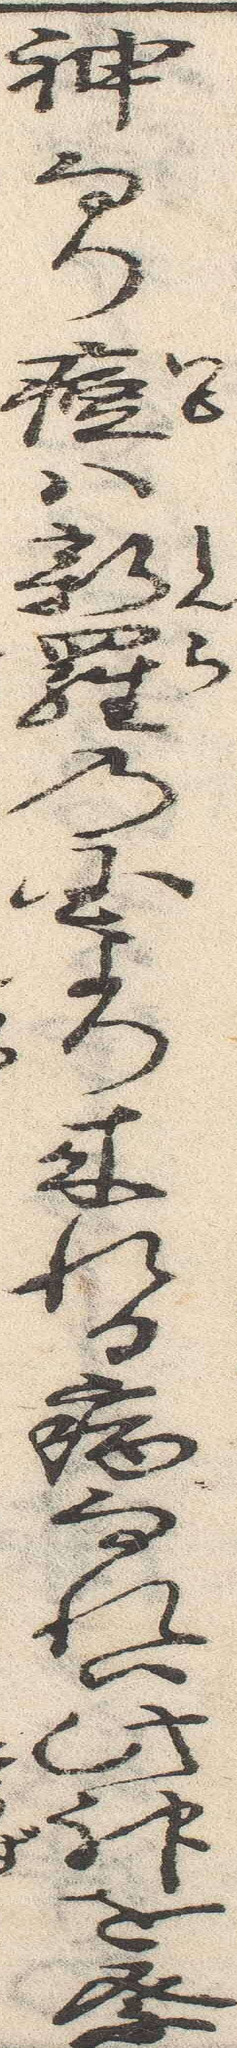神なり痘は新羅の国より来れる病なれは此神を祭
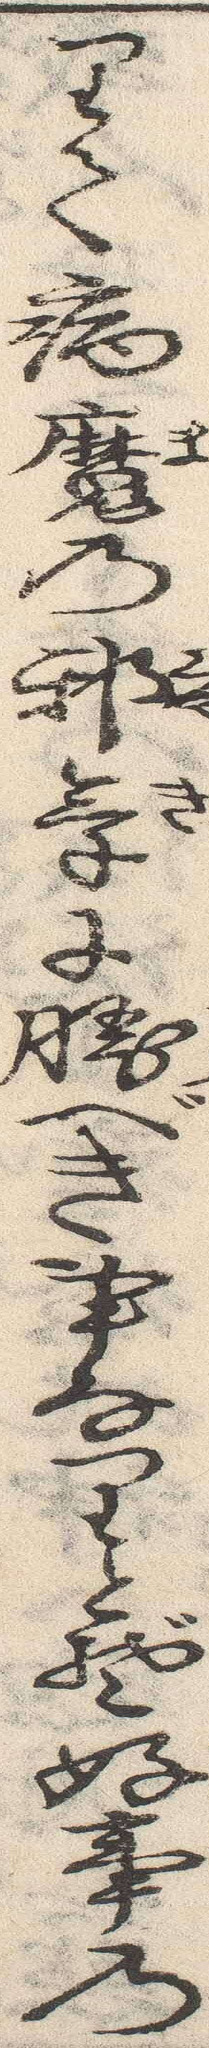りて病魔の邪気に勝べき事なりとぞ好事の
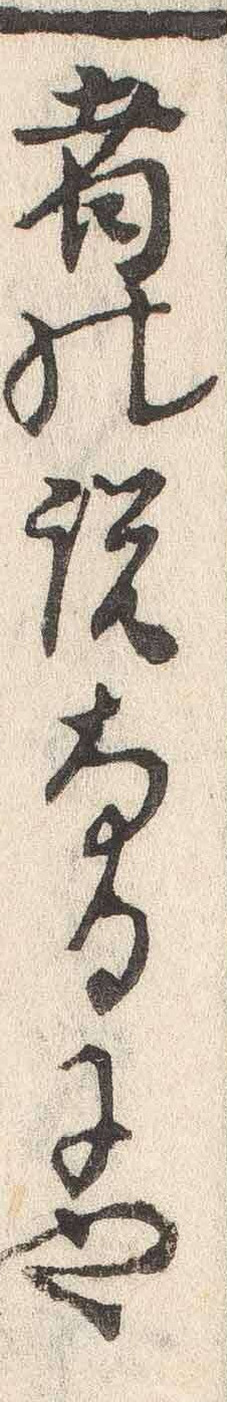者の説なるにや
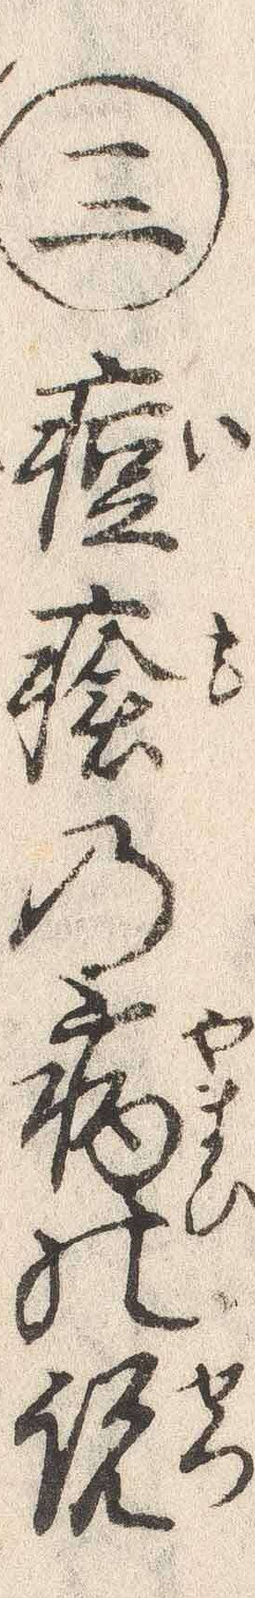㊂痘瘡の病の説
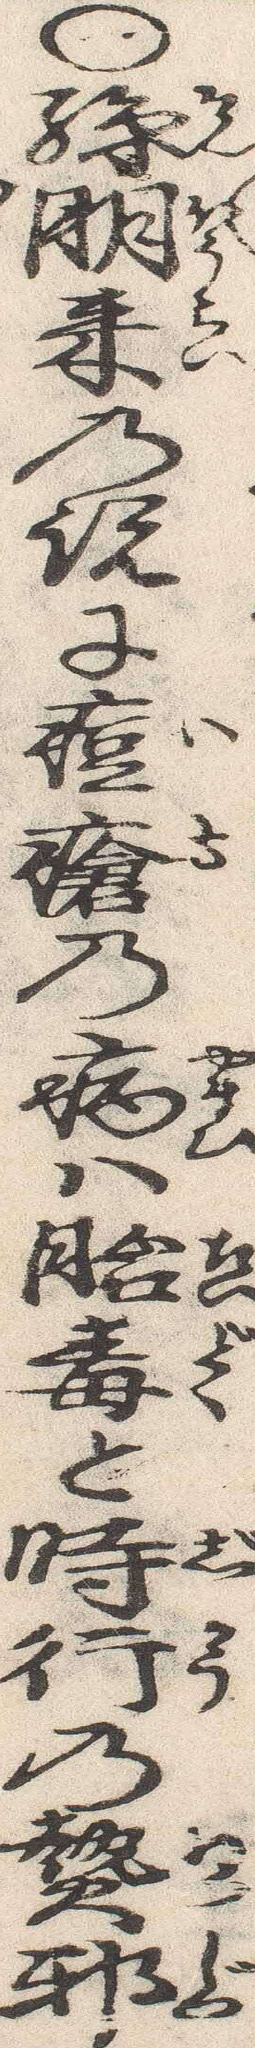○孫朋来の説に痘瘡の病は胎毒と時行の熱邪
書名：小児必用養育草
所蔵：東京学芸大学附属図書館 国文学研究資料館
